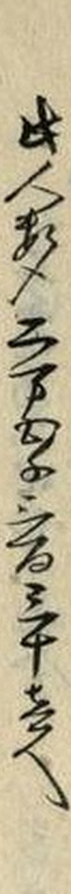此人数〆二万五千三百三十壱人
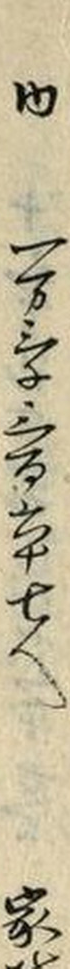内一万三千三百六十七人家持
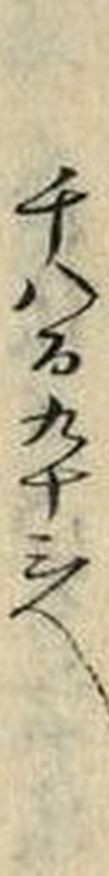千八百九十三人門前
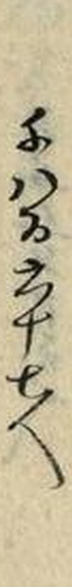千八百六十七人借家

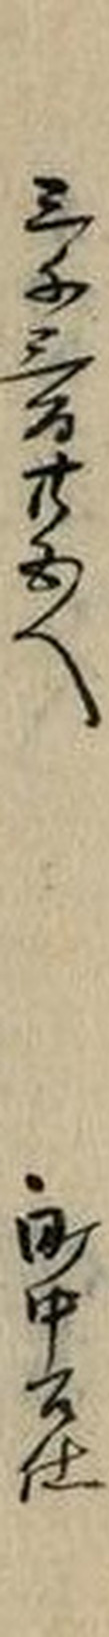三千三百廿五人町中召仕
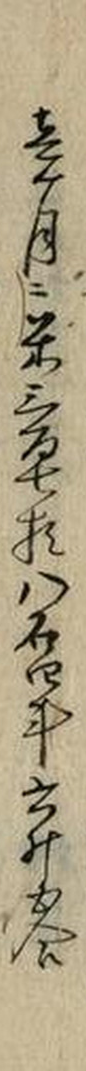壱ケ月ニ米三百七拾八石四斗六升五合
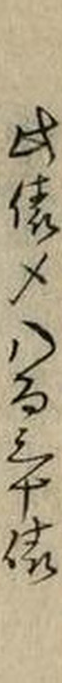此俵〆八百三十俵
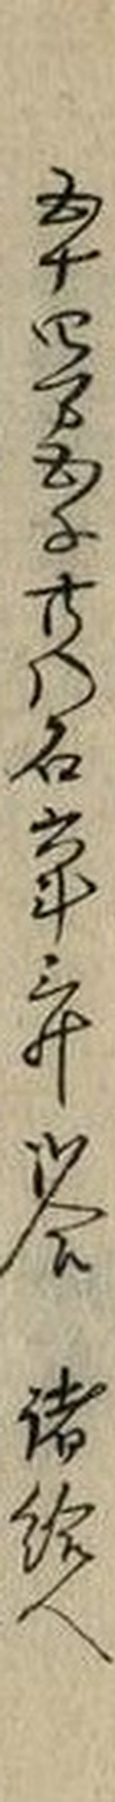五十四万五千廿八石六斗三升弐合諸給人
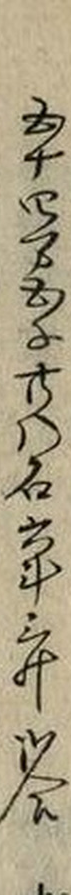五十四万五千廿八石六斗三升弐合諸給人
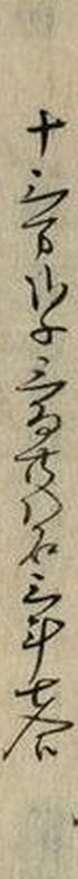十三万弐千三百廿八石三斗七合御蔵入
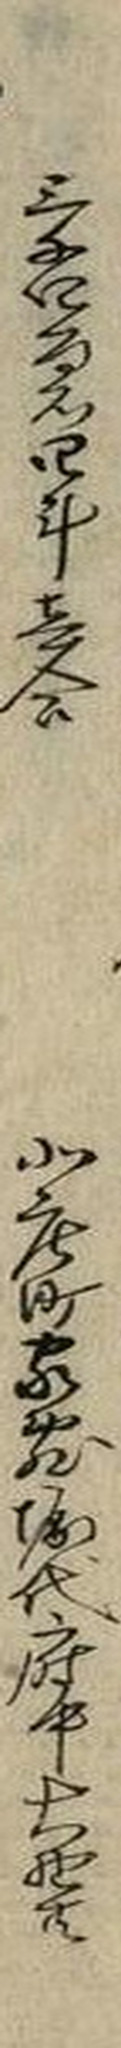三千四百石四斗壱合北庄町家敷堀代府中大野共
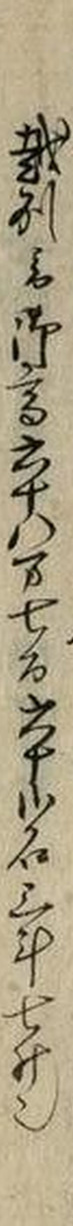越州ニ而御高六十八万七百六十弐石三斗七升也
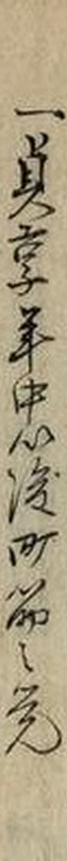一貞享年中以後町筋之覚
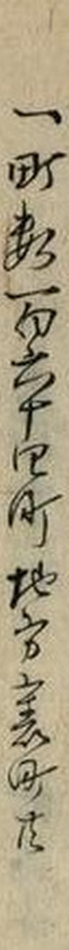一町数百六十四町地方裏町共
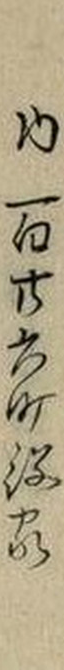内百廿六町役家
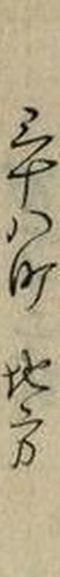三十八町地方
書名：御国他国諸事之部
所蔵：福井県文書館 Fukui Prefectural Archives
